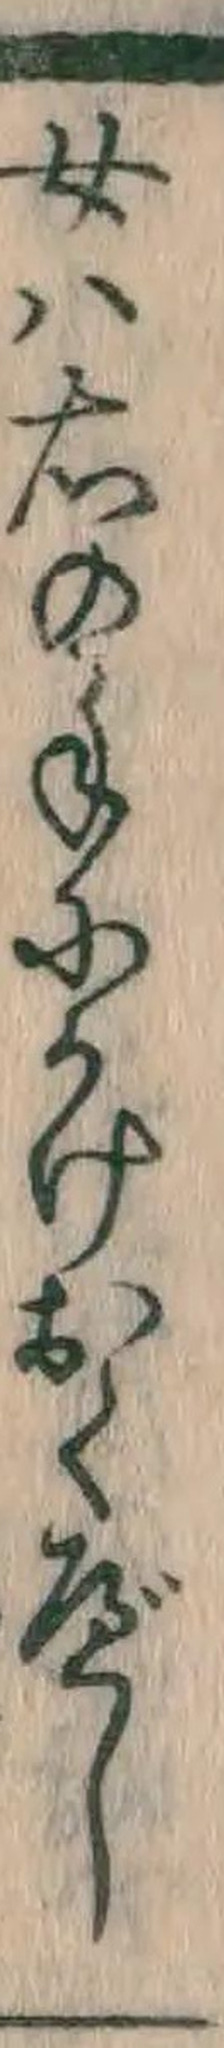女は右の手にかけおくべし
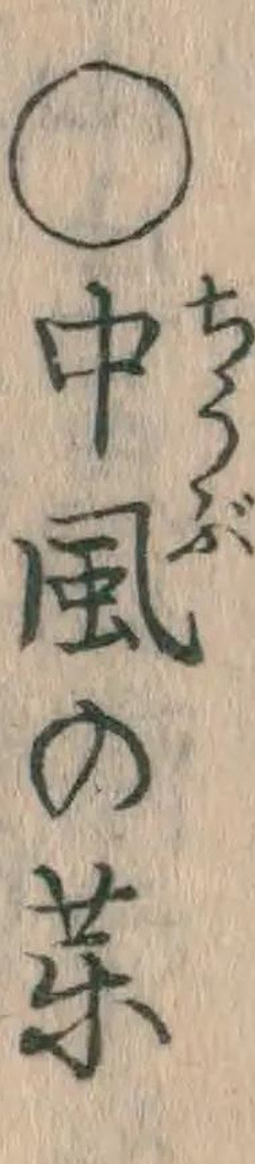○中風の薬
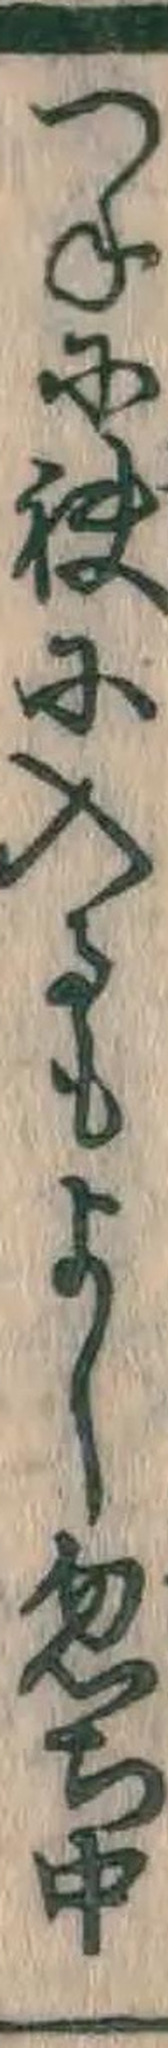つねに袂に入るもよし忽ち中
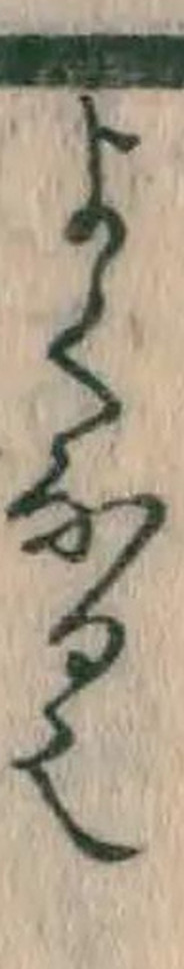よくなる也
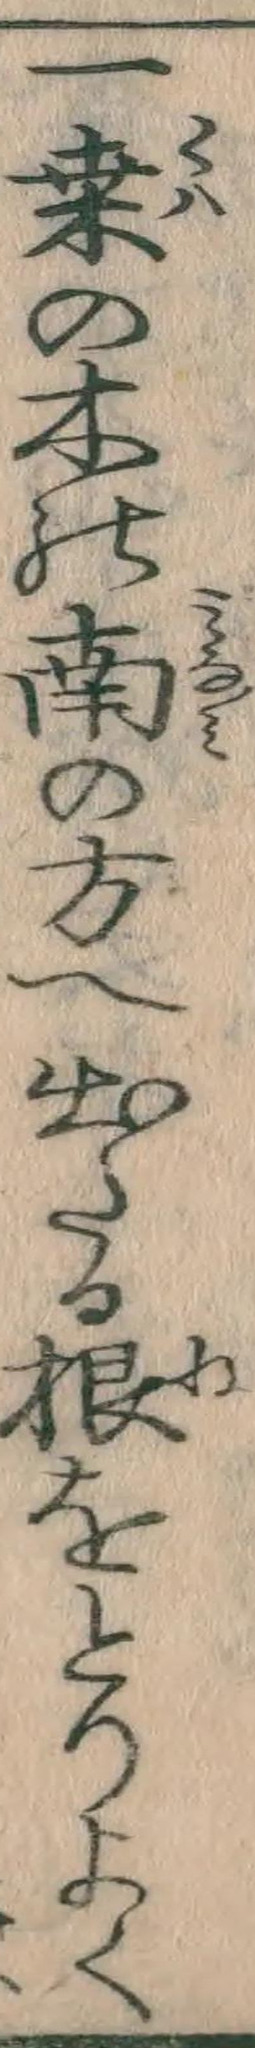一桑の木の南の方へ出たる根をとりよく
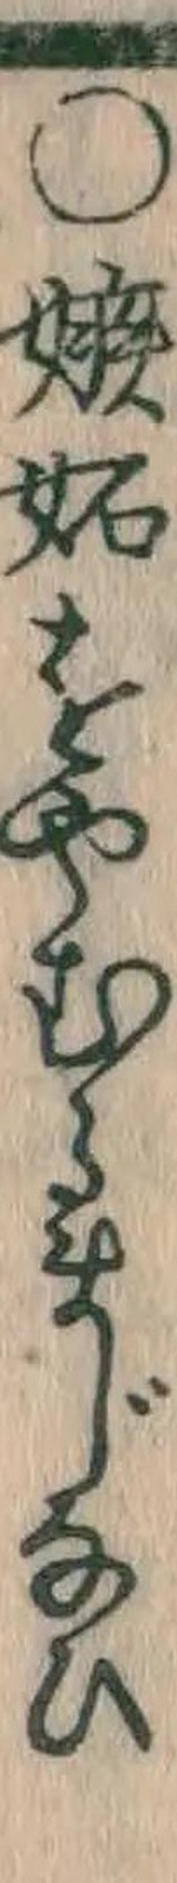○嫉妬をやむるまじなひ
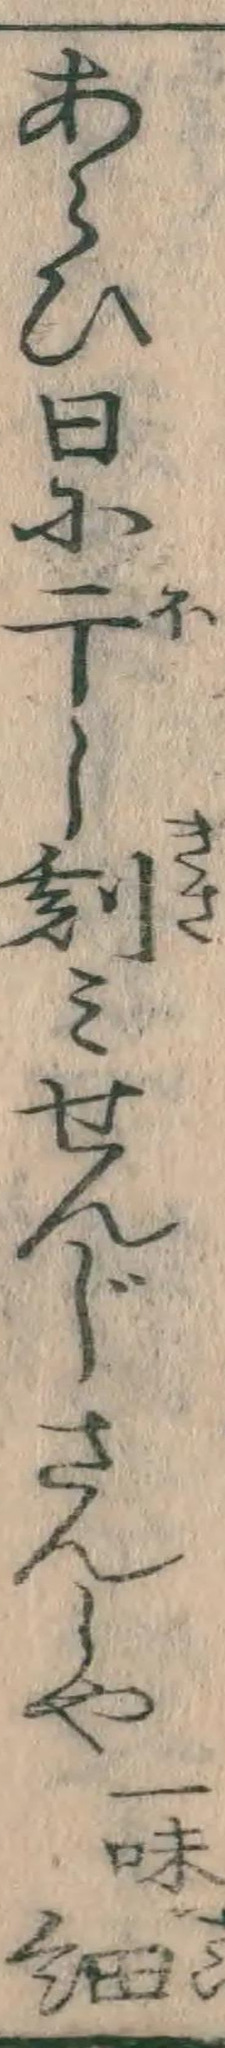あらひ日に干し刻みせんじさんしや一味細
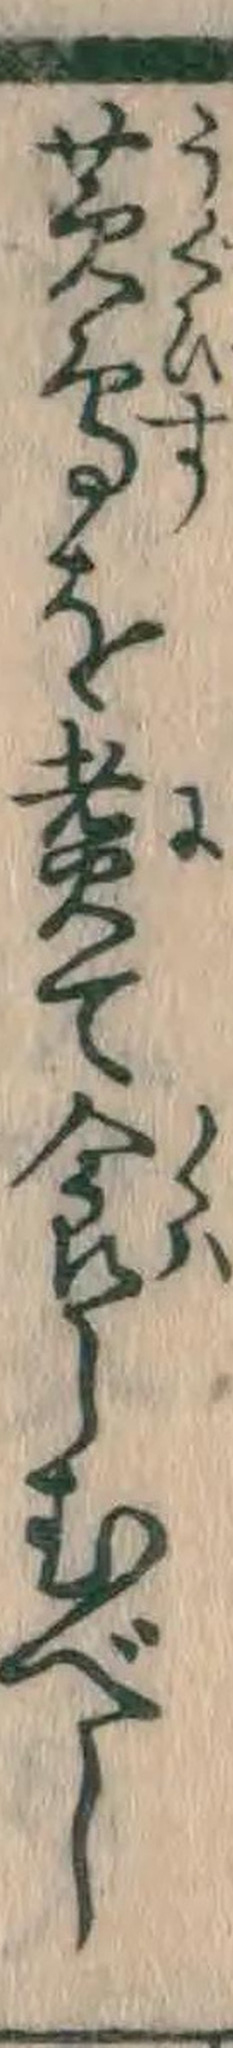黄鳥を煮て食しむべし
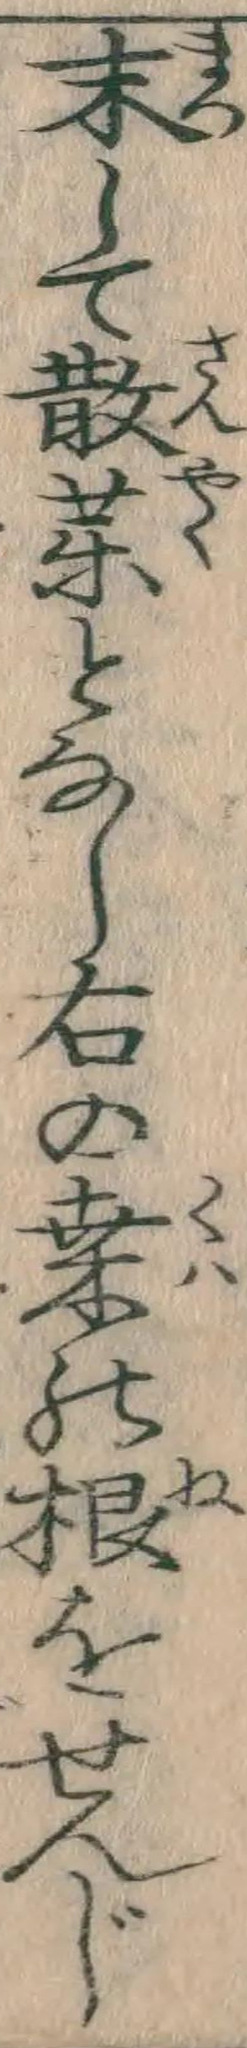末して散薬となし右の桑の根をせんじ
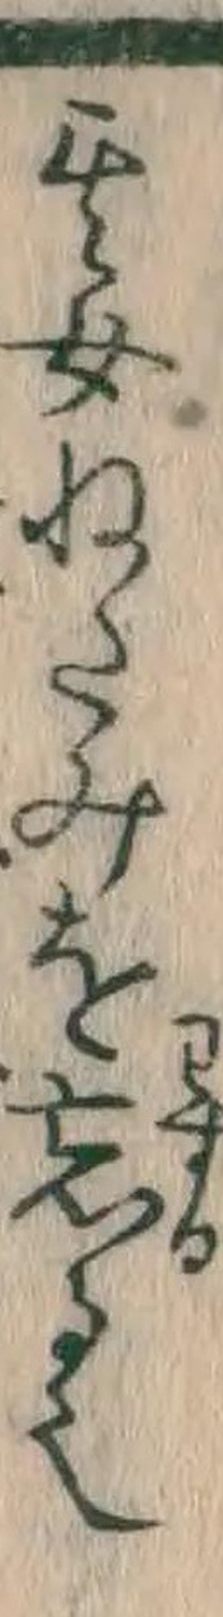其女ねたみを忘る也
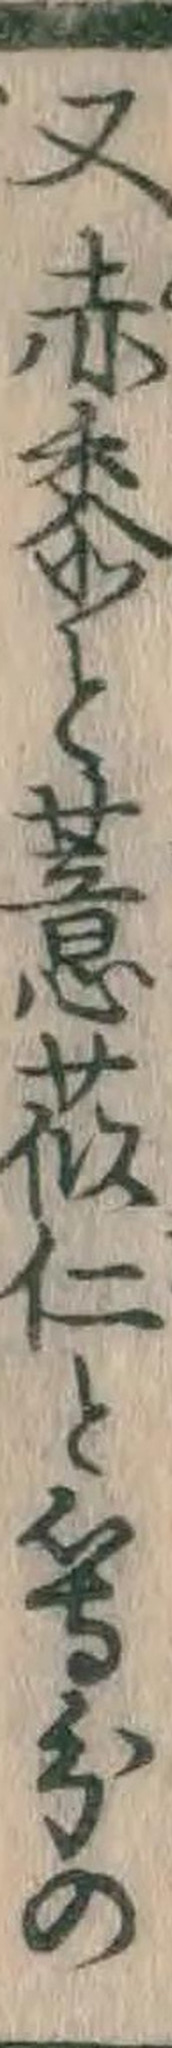又赤黍と薏苡仁と等分の
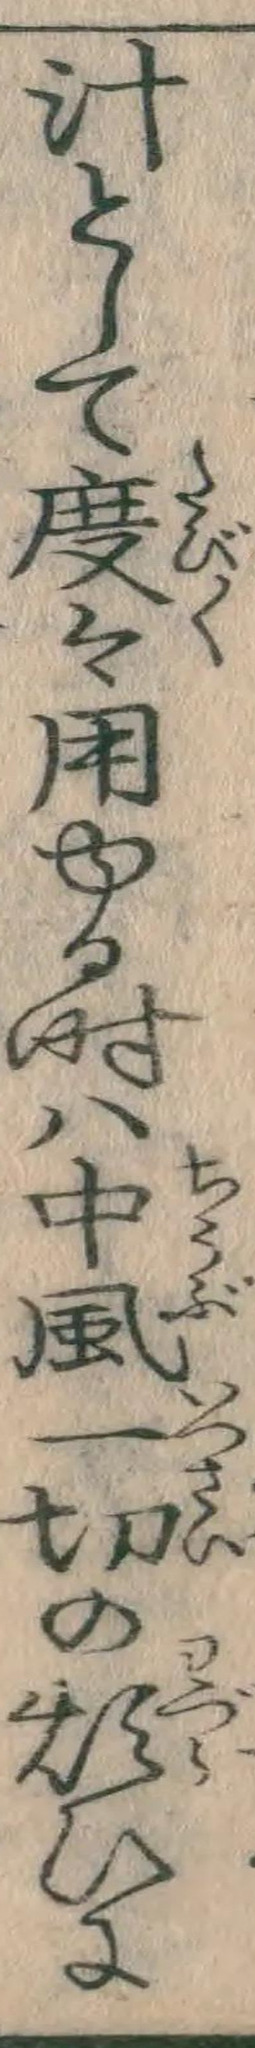汁として度々用ゆる時は中風一切の煩ひに
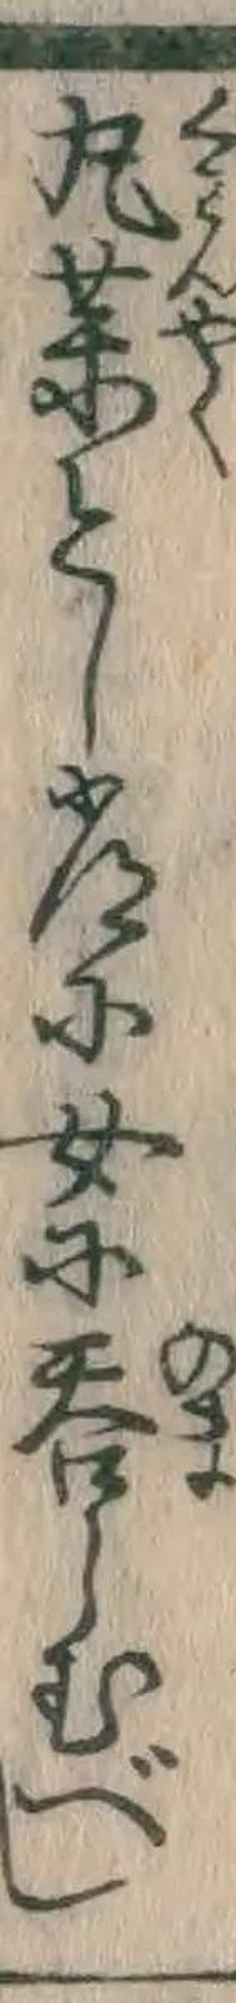丸薬とし常に女に呑しむべし
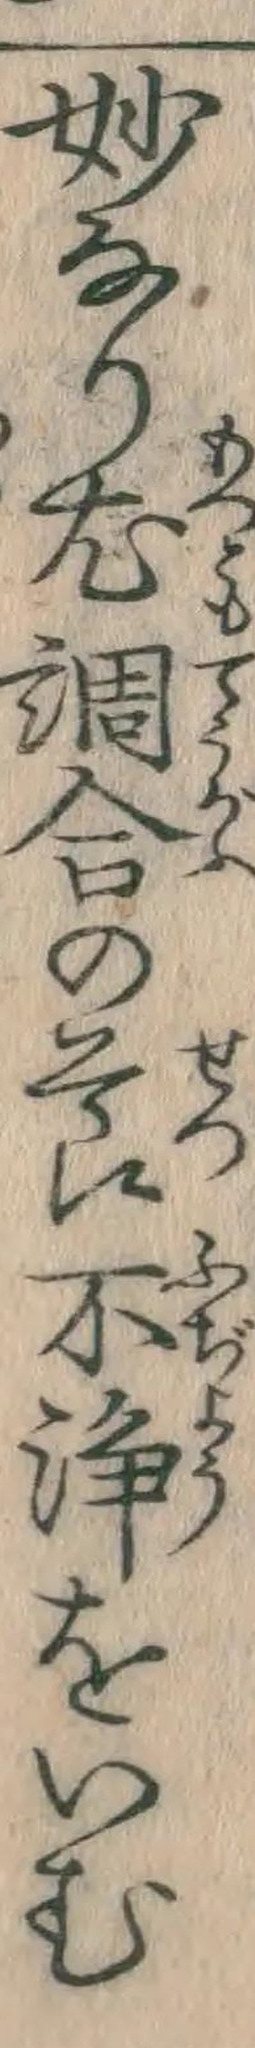妙なり尤調合の節不浄をいむ
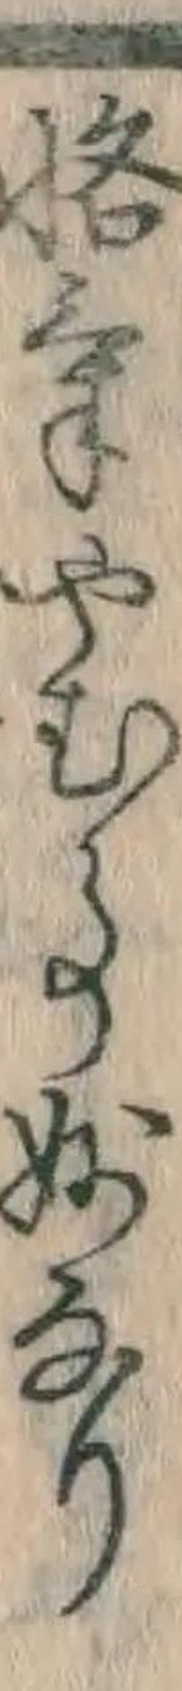悋気やむ事妙なり
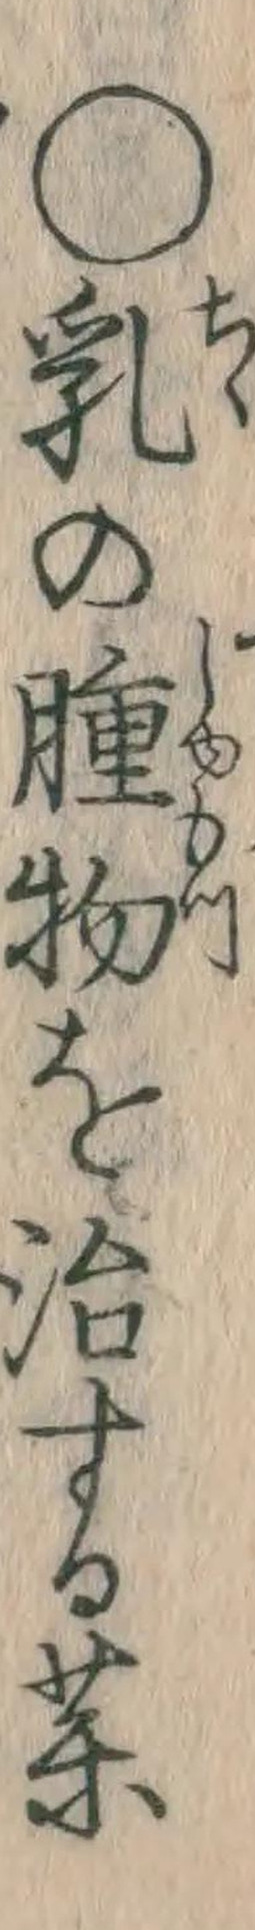○乳の腫物を治する薬
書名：広益秘事大全 3巻. [4]
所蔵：国立国会図書館 National Diet Library, JAPAN
